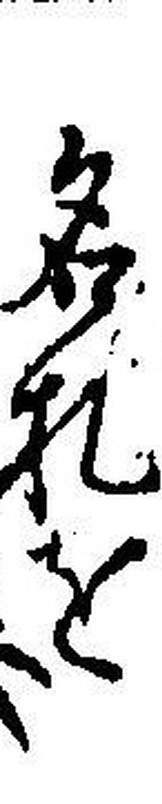名札を
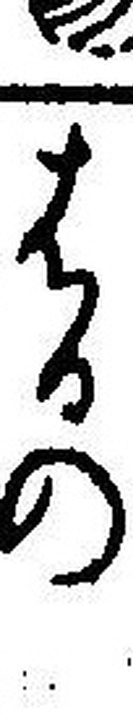はるの
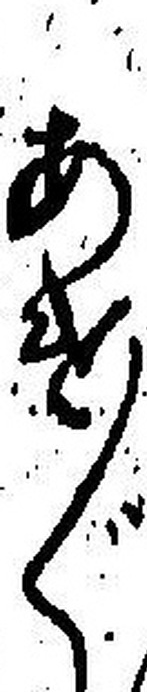あけ〳〵
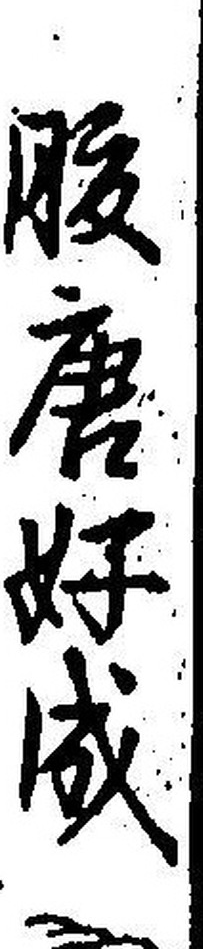腹唐好成
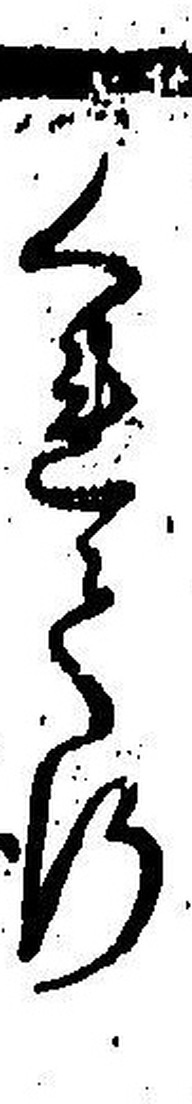くれて行
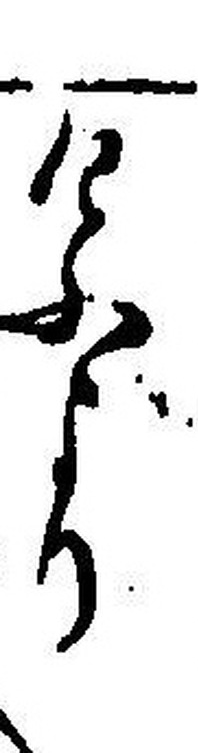けふより
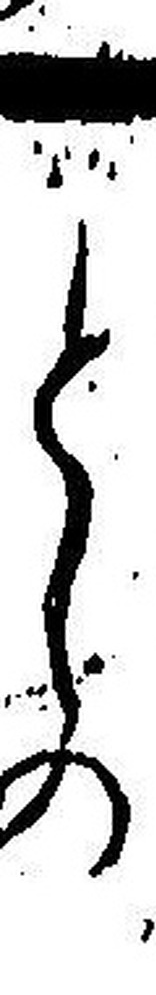としの
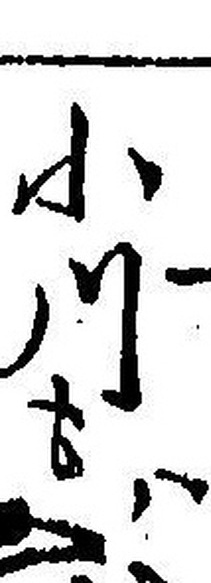小川も
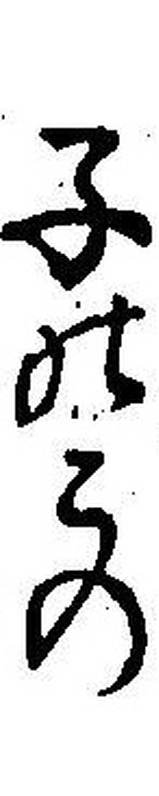子のこの
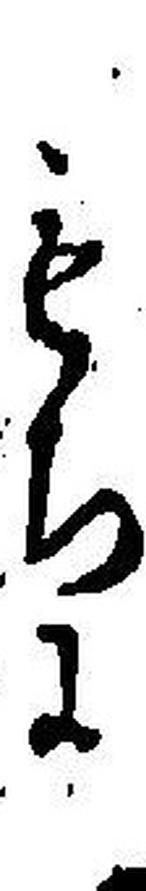もちに
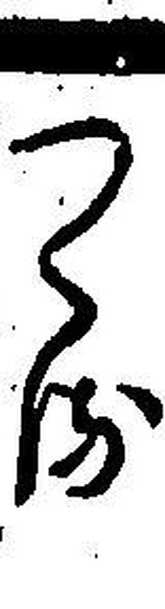つくる
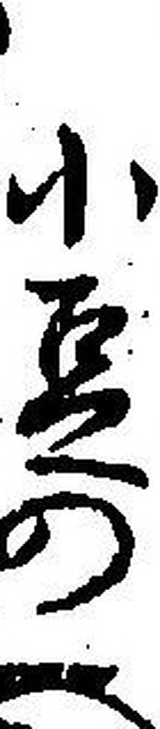小豆の
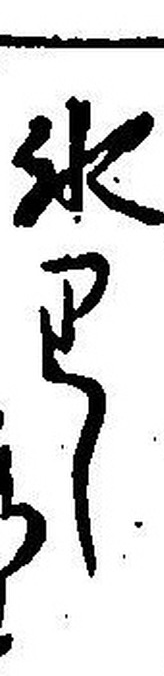氷りし
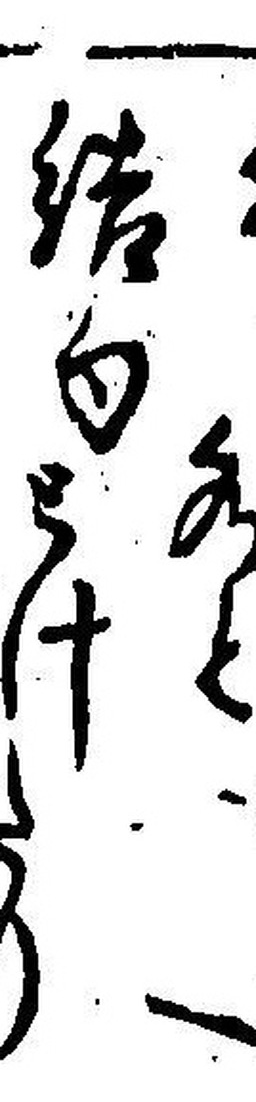結句とけたり
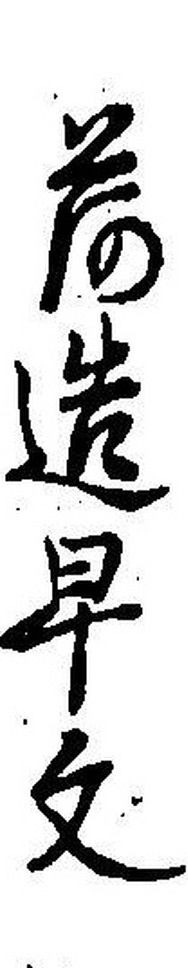荷造早文
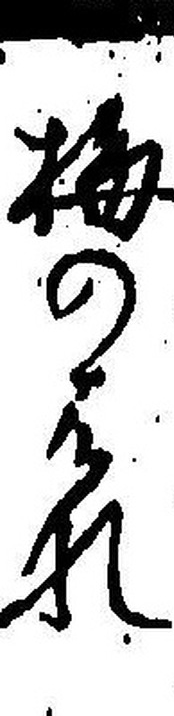梅のはな
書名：どうれ百人一首 / 鹿都部真顔(狂歌堂)編
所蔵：東京大学総合図書館 General Library in the University of Tokyo, JAPAN
